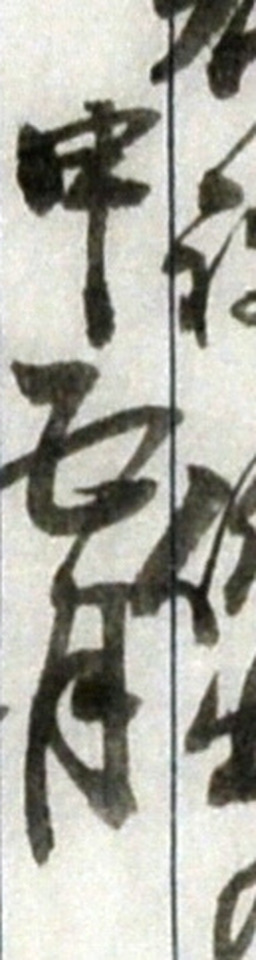申五月
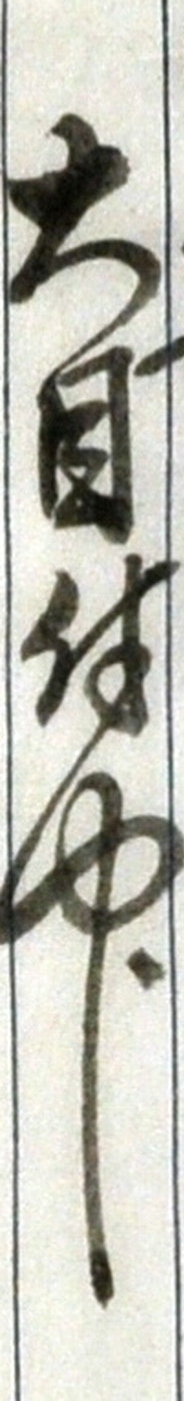大目付中

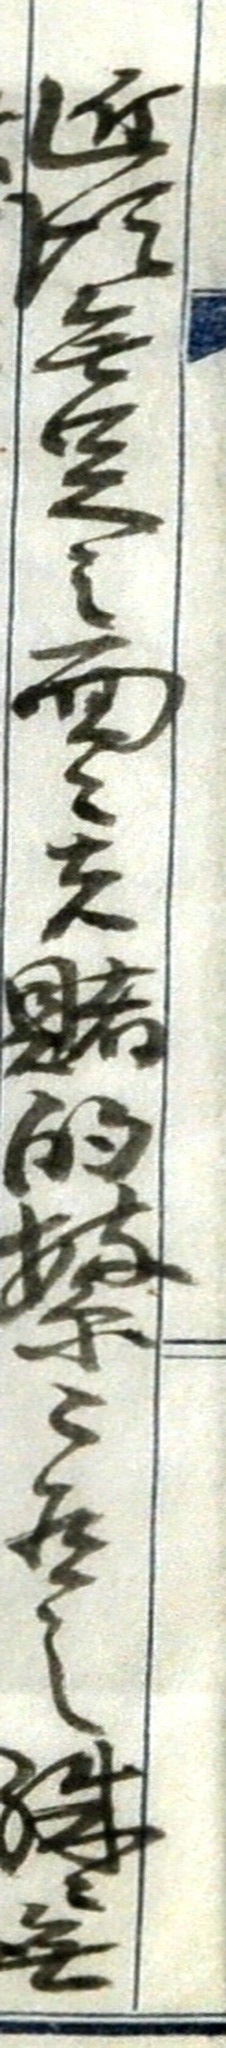近頃無足之面々者賭的繁ニ有之殊ニ無
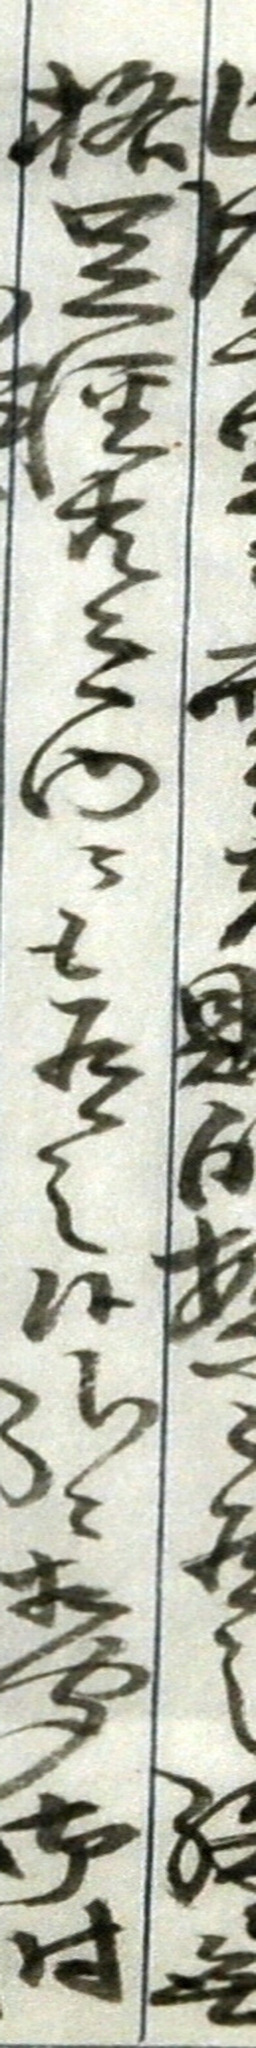格足軽共之内ニも有之候哉ニ相聞御時
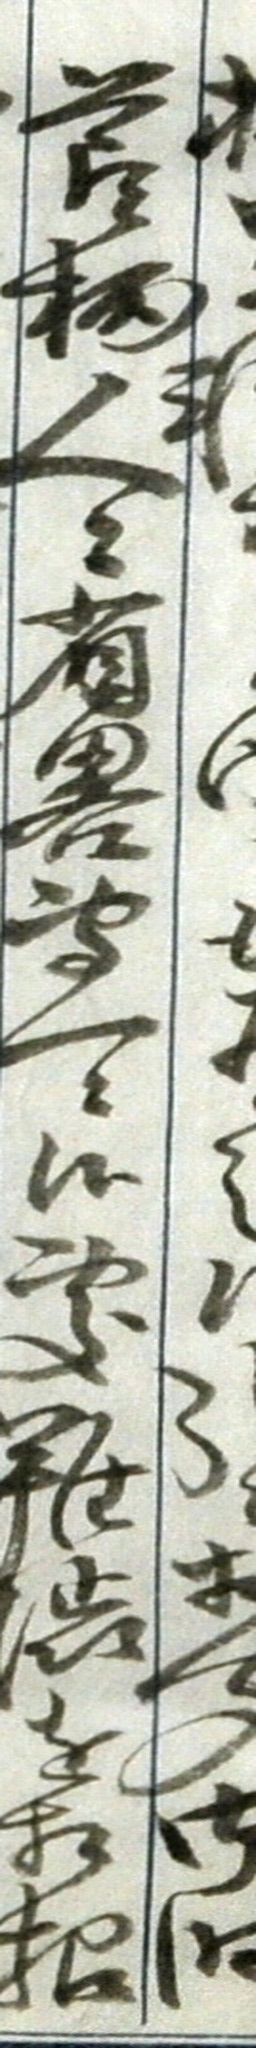節柄人々省略専一ニ候処難渋を相招
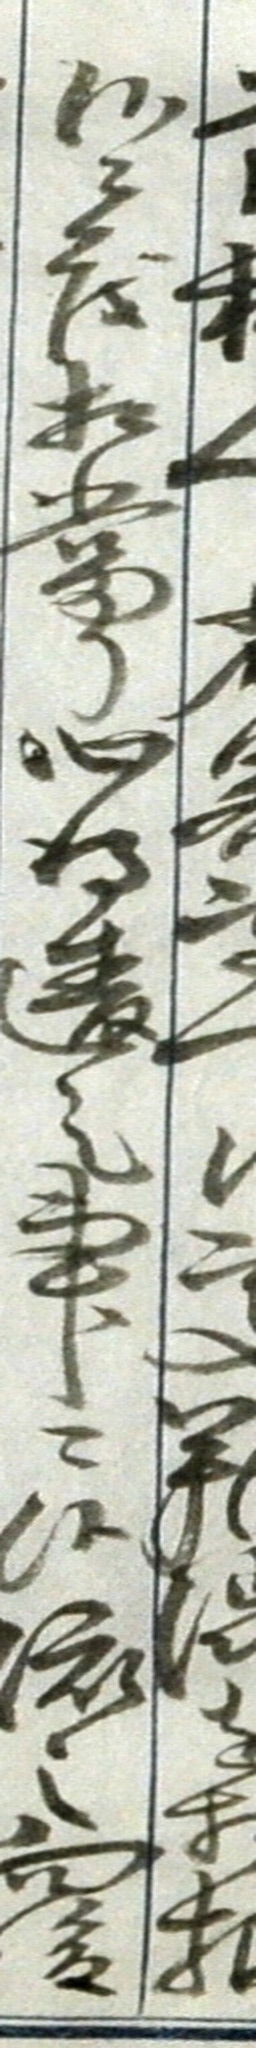候ニも相当り心得違之事ニ候依之向後
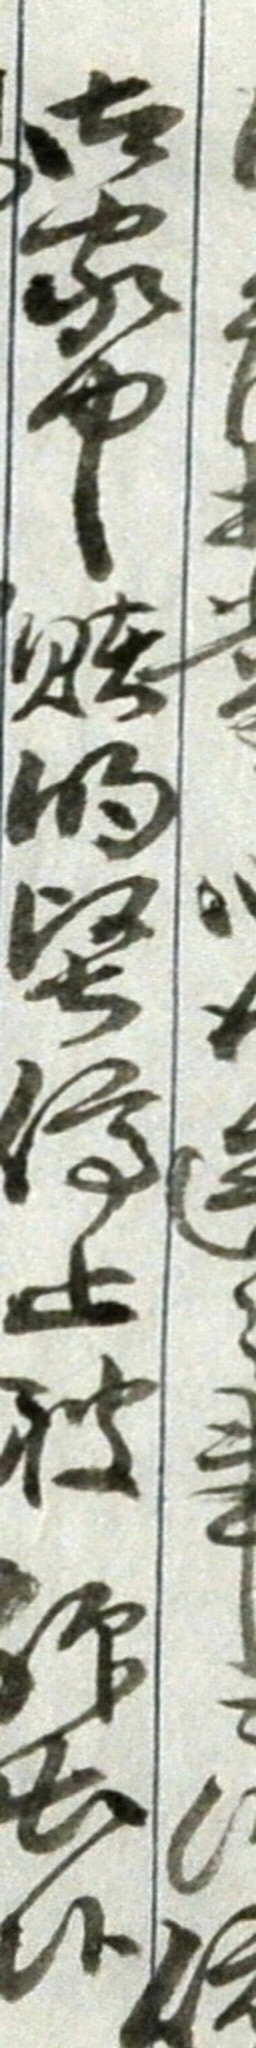御家中賭的堅停止被仰出候
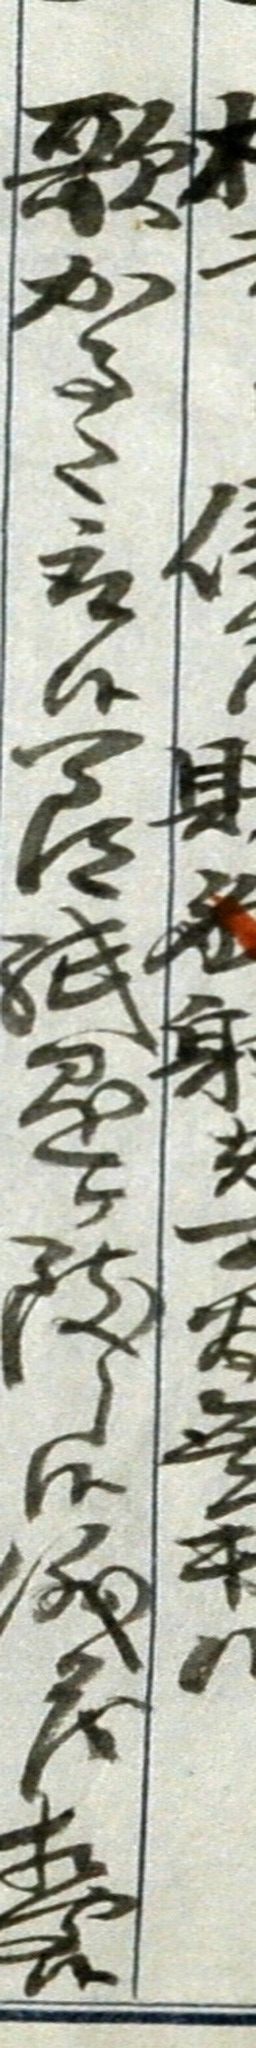一歌かるた取候節紙懸ヶ致し候儀も相聞候
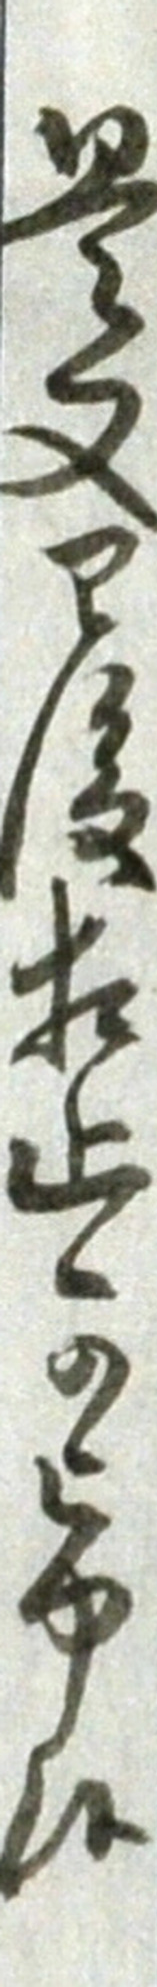是又已後相止可被申候
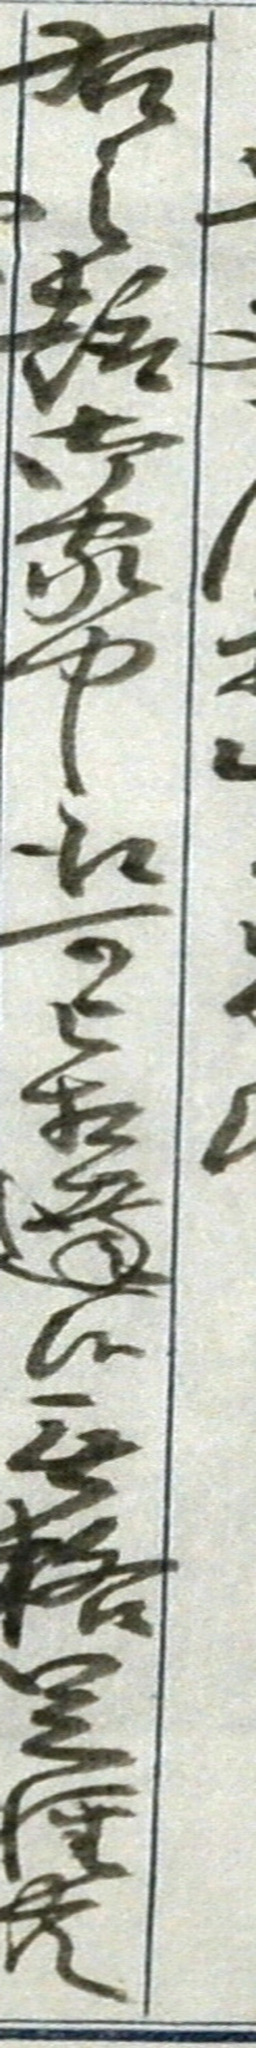右之趣御家中江可被相達候無格足軽共
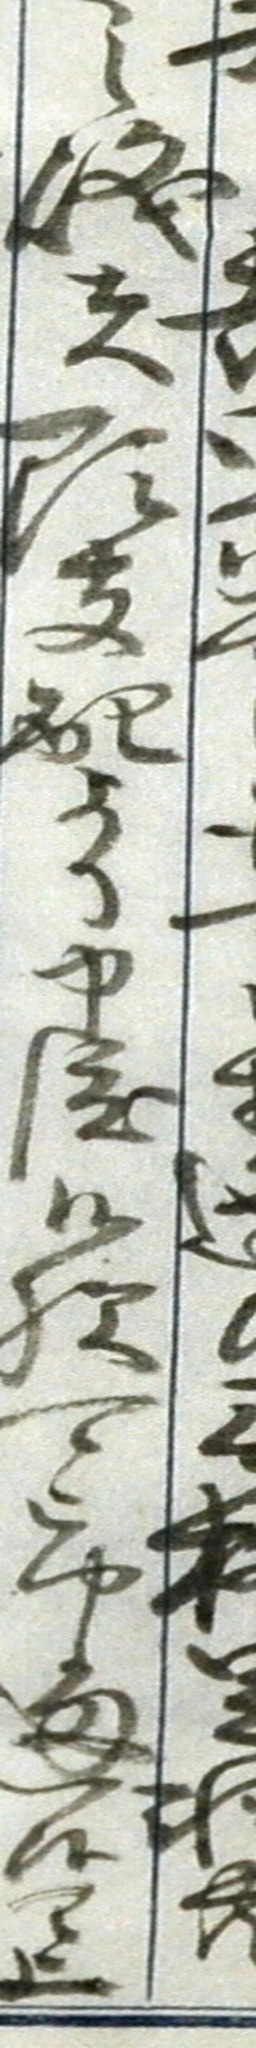之儀は頭支配より申渡候様可被申通候已上
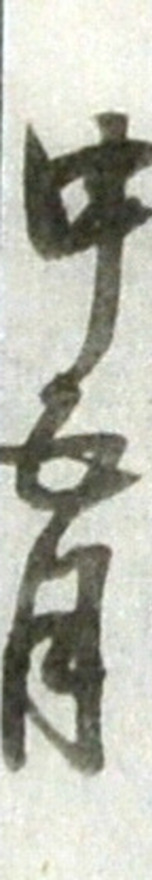申五月
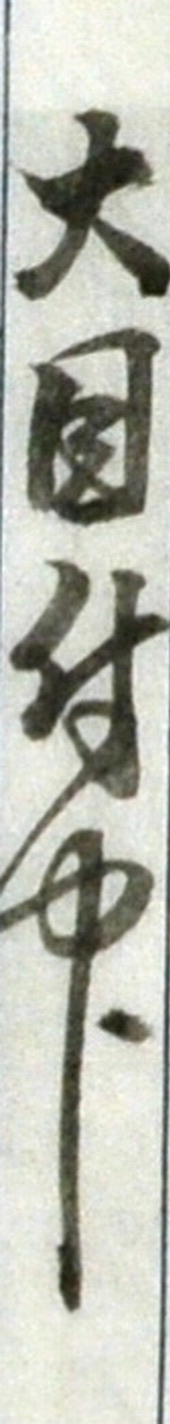大目付中
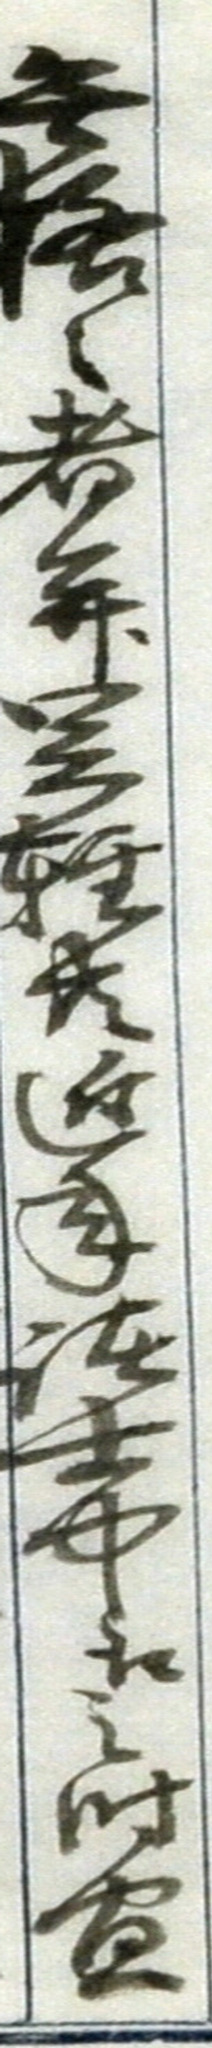無格之者并足軽共近年諸士中江之時宜
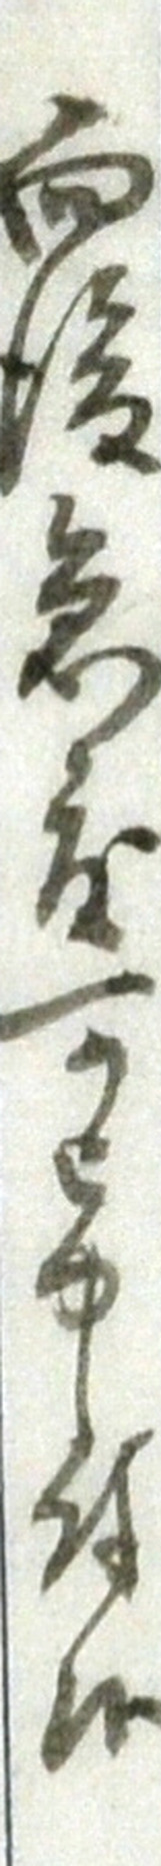向後急度可被申付候
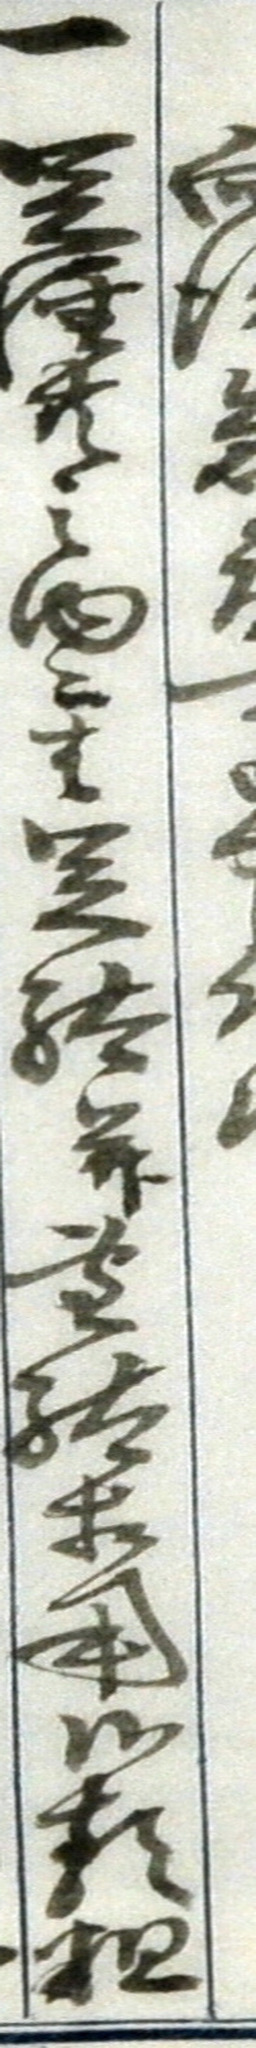一足軽共之内ニは足駄并雪駄相用候類粗
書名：御倹約被仰出書
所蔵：伊那市立高遠町図書館・合同会社AMANE
